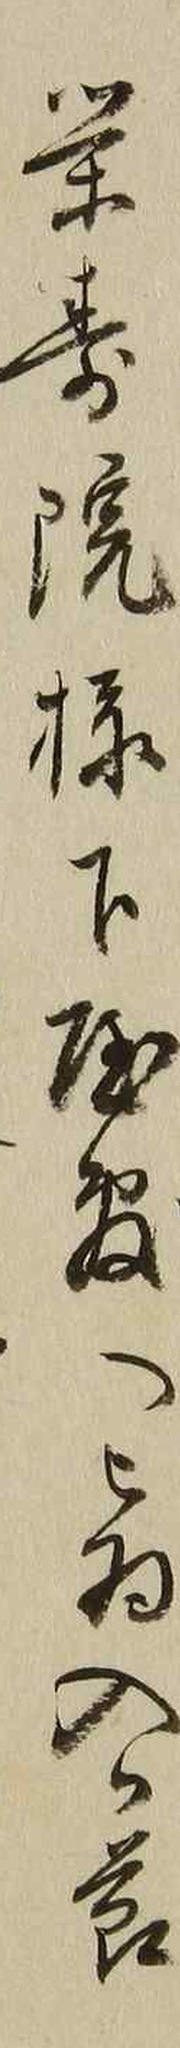栄寿院様下屋敷へ被為入候節
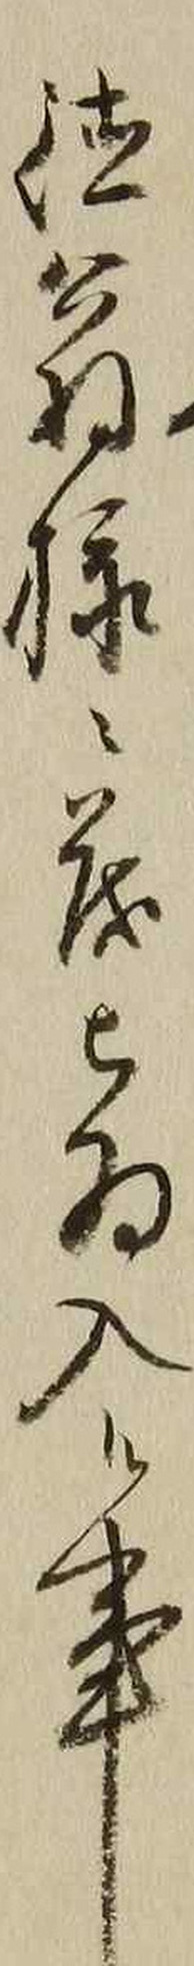徳翁様にも被為入候事
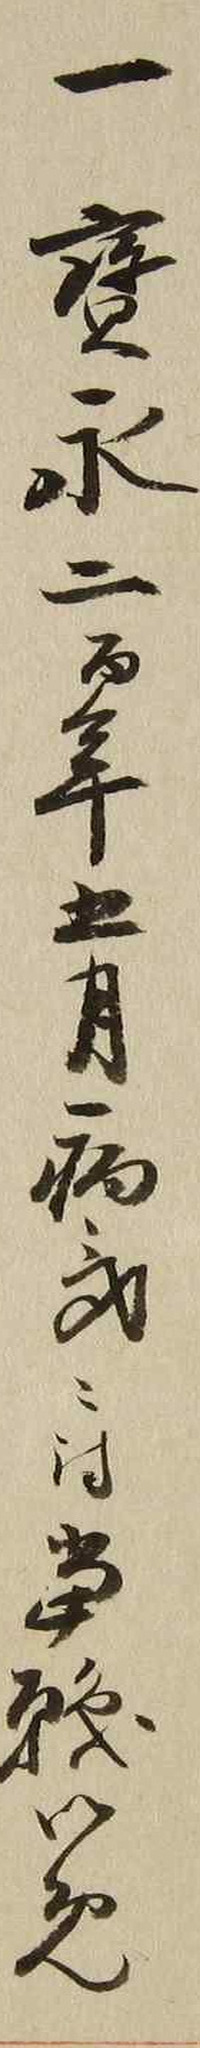一宝永二酉年五月病気に付当職御免
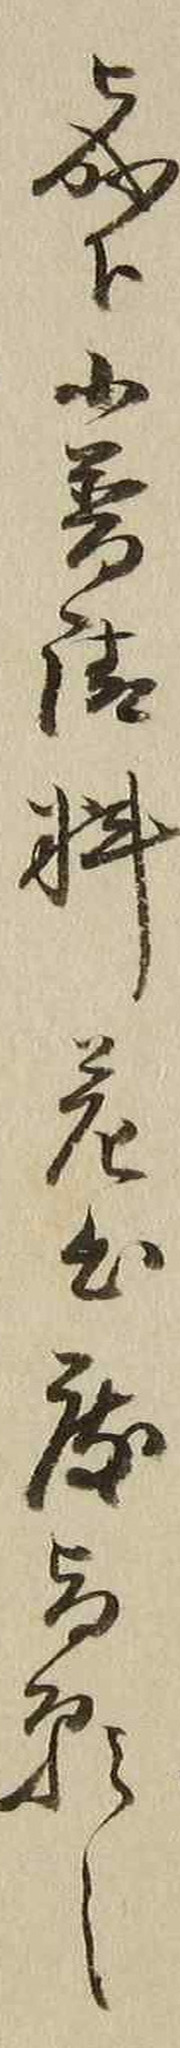被成下小普請料差出度旨願之
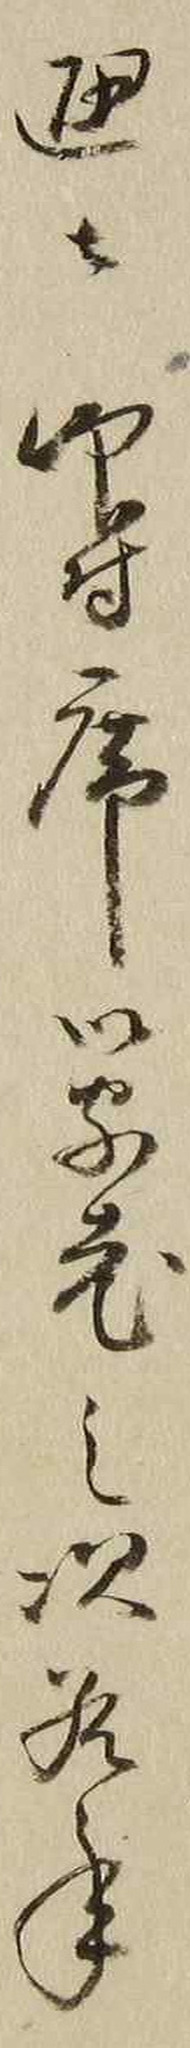通被仰付席御家老之次若年
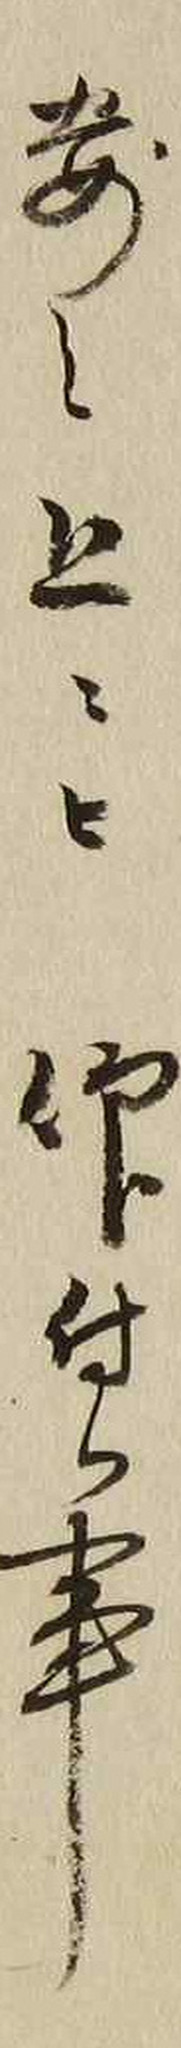寄之上に被仰付候事
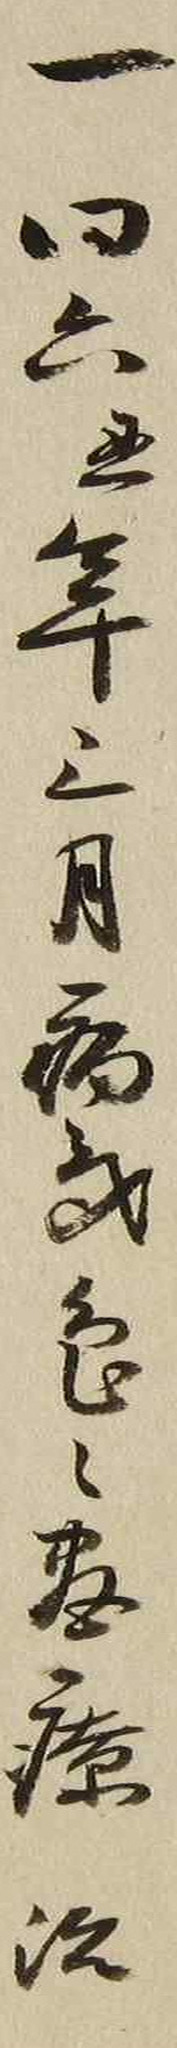一同六丑年三月病気色々盡療治
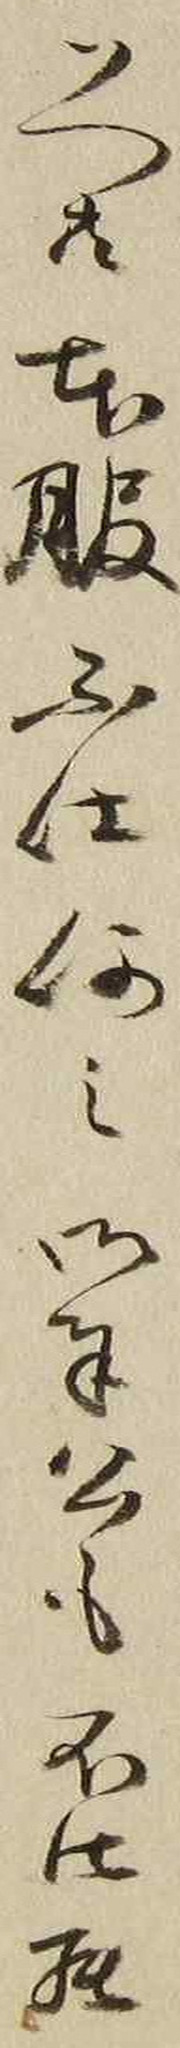候へ共本復不仕何之御奉公も不仕罷
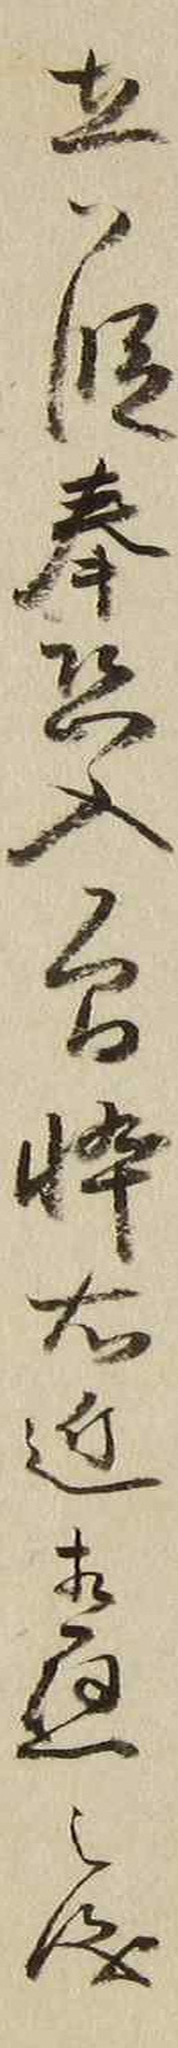在候段奉恐入候間忰右近相応之儀
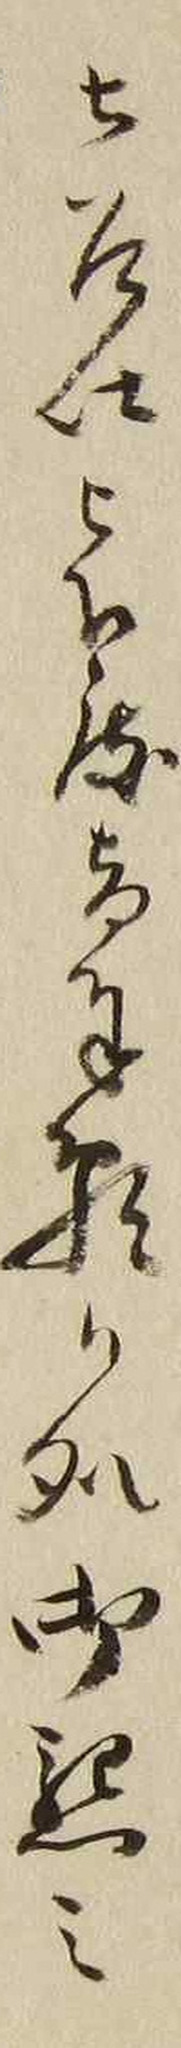被召仕被下度旨奉願候処御懇之
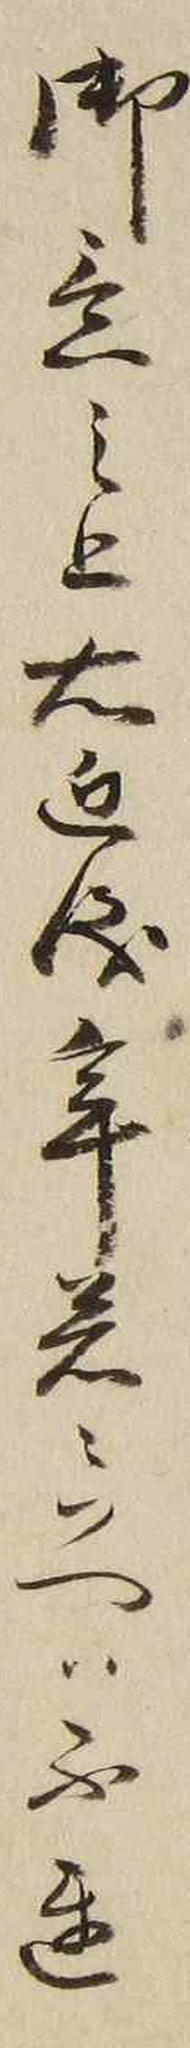御意之上右近儀年若に候へは不速
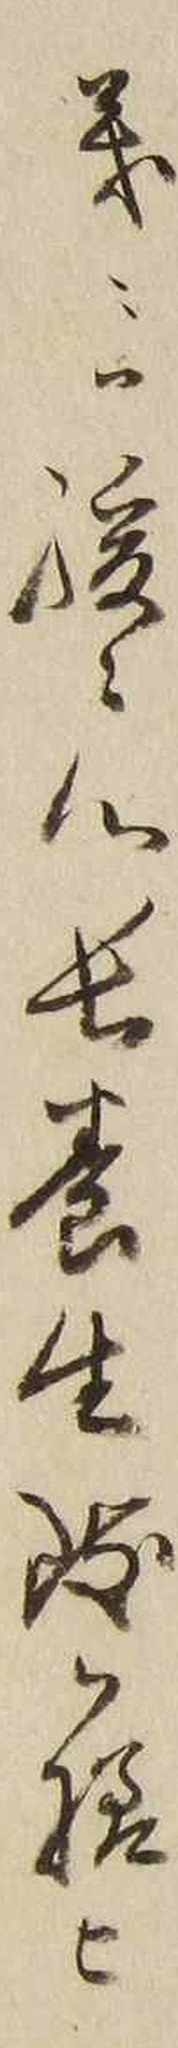義に而緩々心長養生致候様被

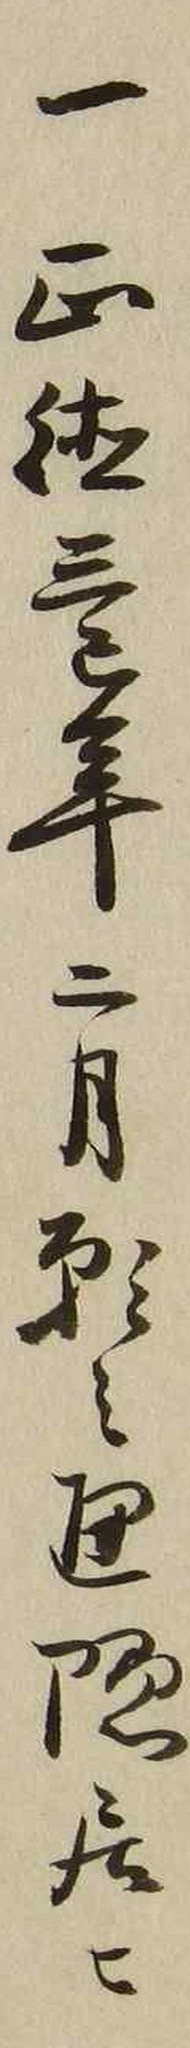一正徳三巳年二月願之通隠居被
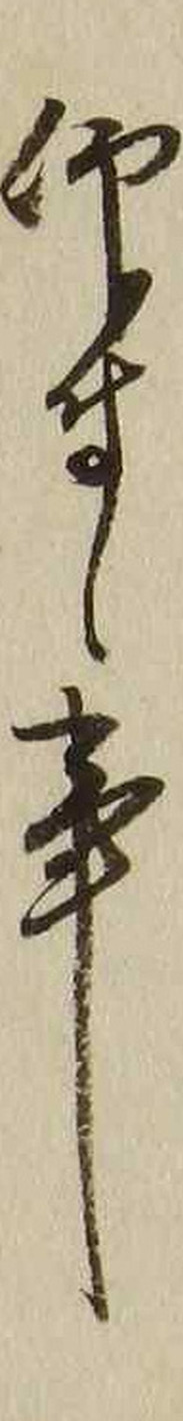仰付候事
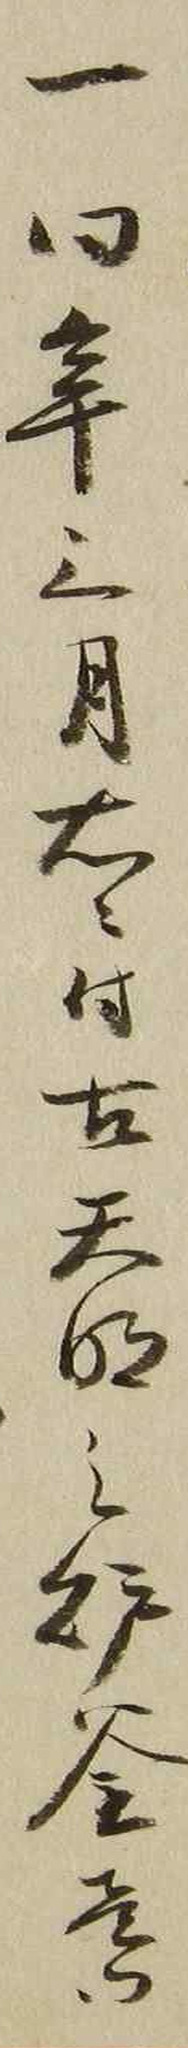一同年三月右に付古天明之炉釜壱つ
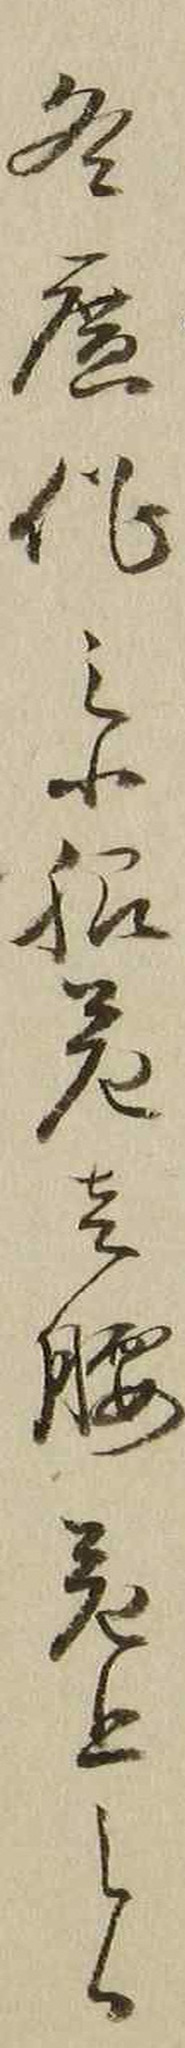冬廣作之小脇差壱腰差上之候事
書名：諸士系譜　巻之269　さ之部1
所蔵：会津若松市立会津図書館
